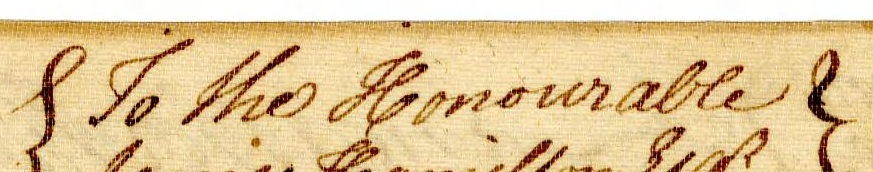To the Honourable
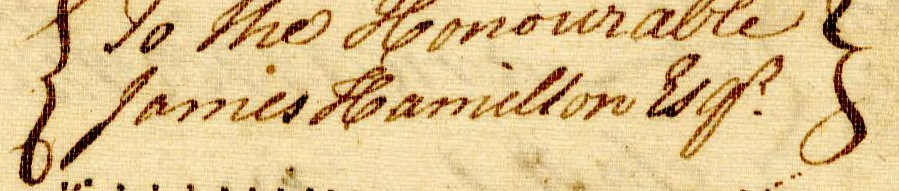James Hamilton Esq^r.
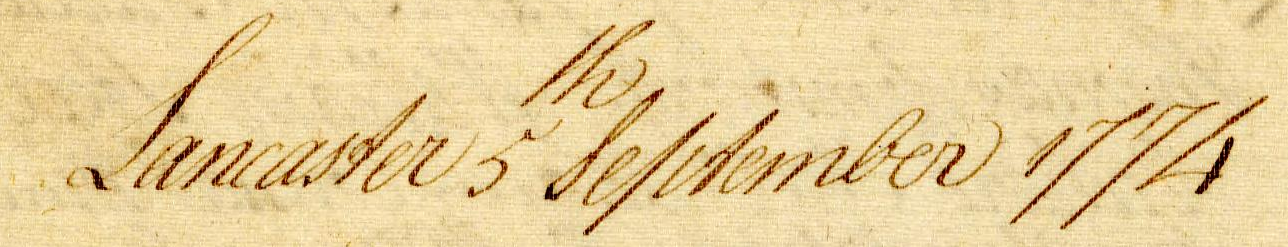Lancaster 5^th September 1774
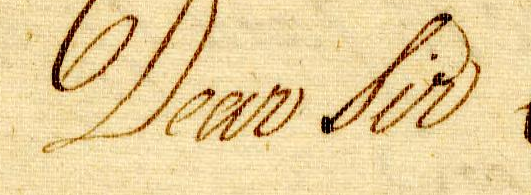Dear Sir
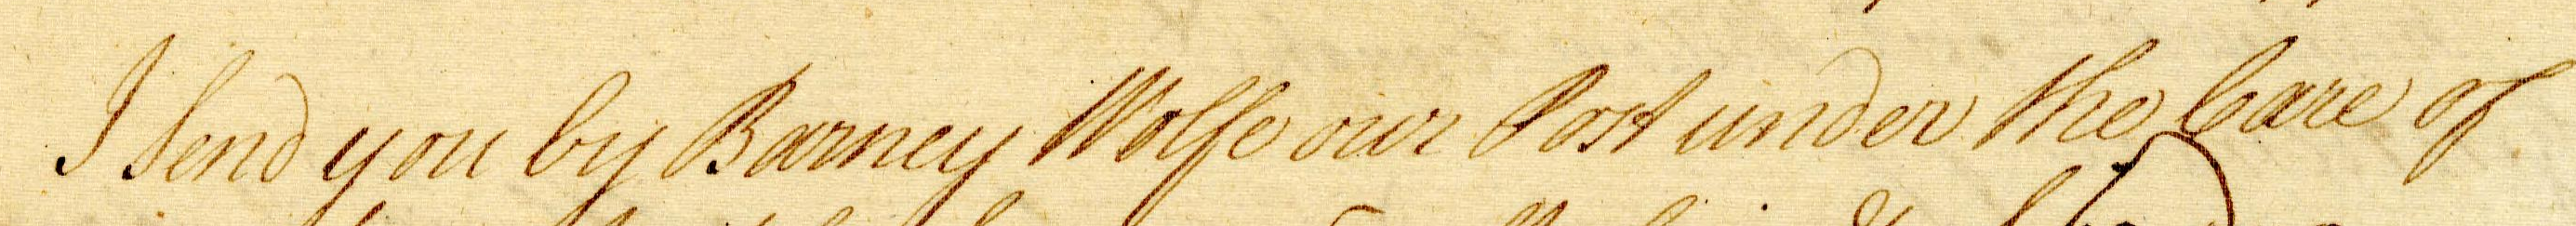I send you by Barney Wolfe our Post under the Care of
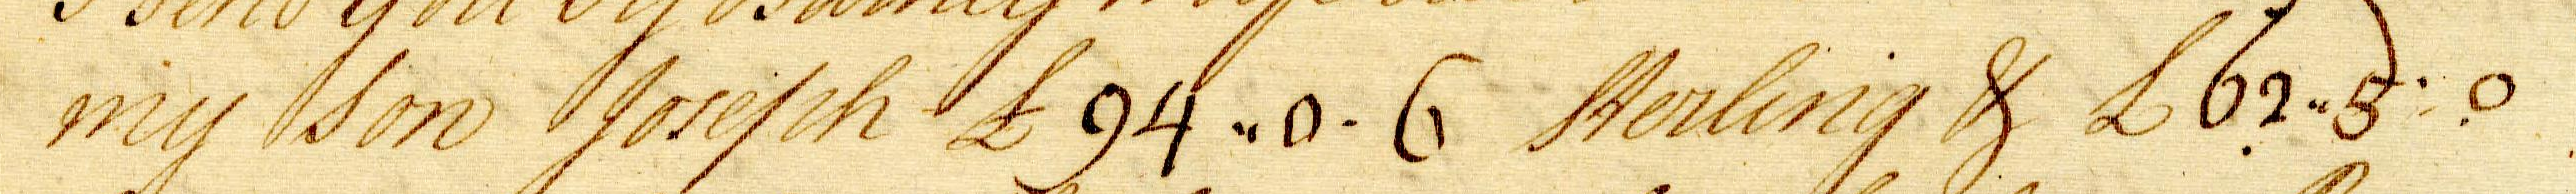my Son Joseph £94..0.6 Sterling & £62..5..0
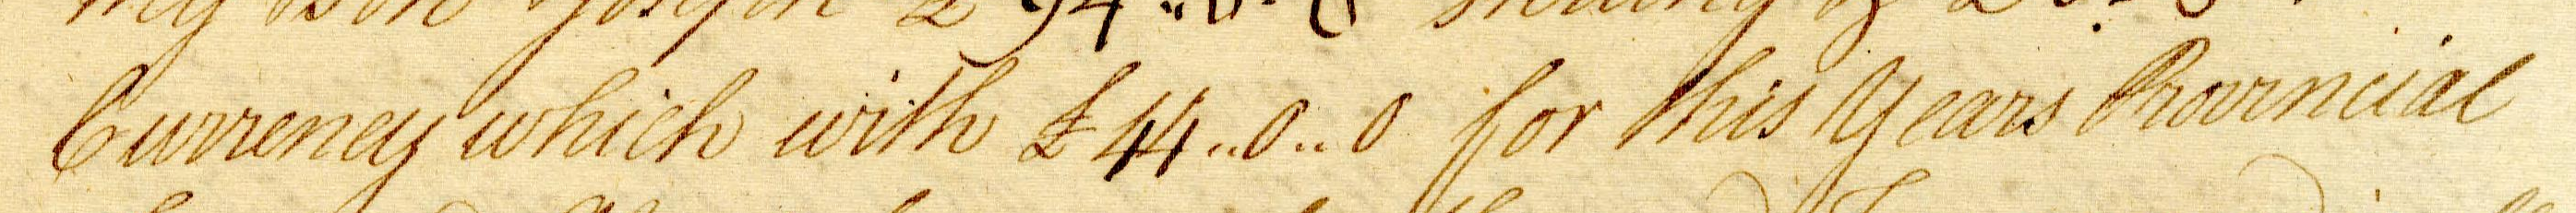Currency which with £44..0..0 for this Years Provincial
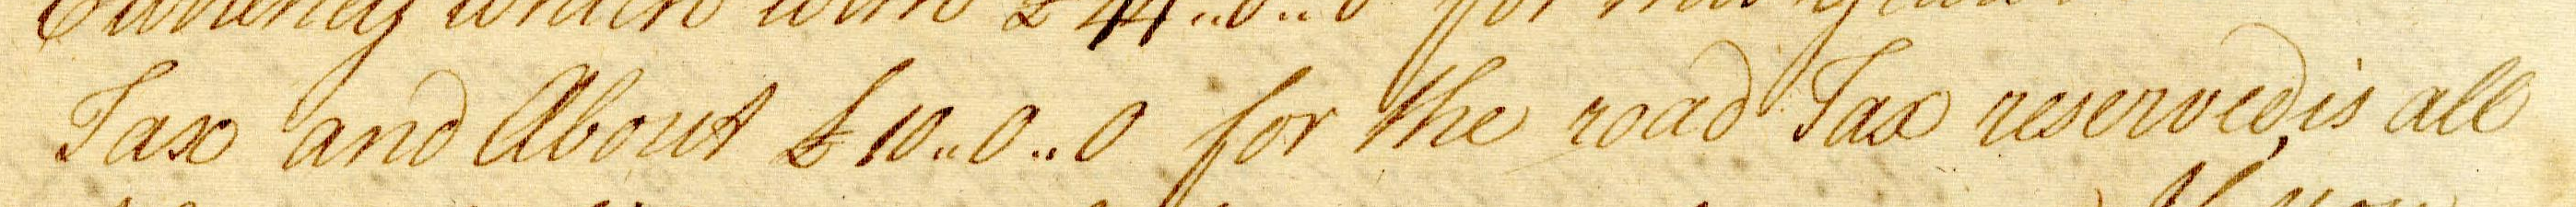Tax and About £10..0..0 for the road Tax reserved is all
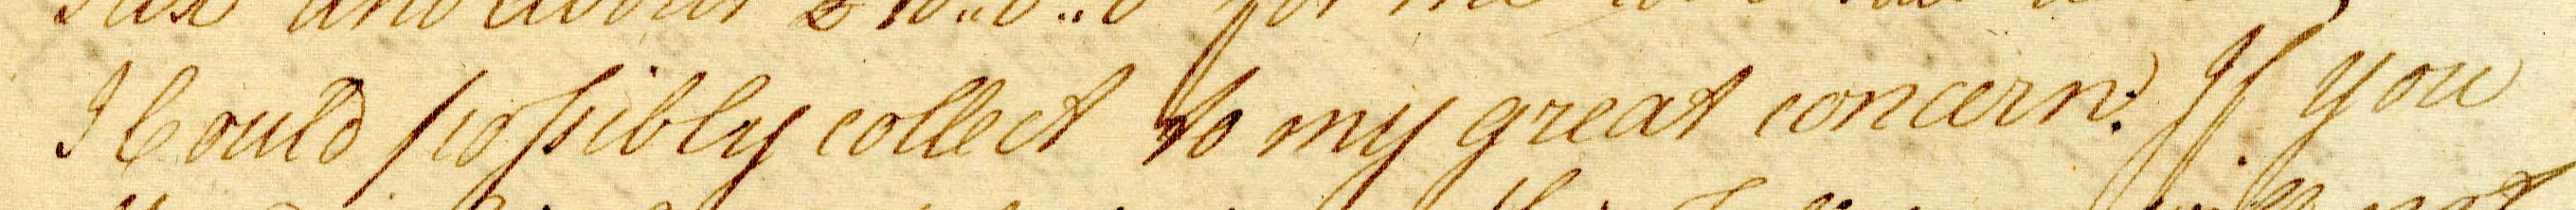I Could possibly collect to my great concern: If you
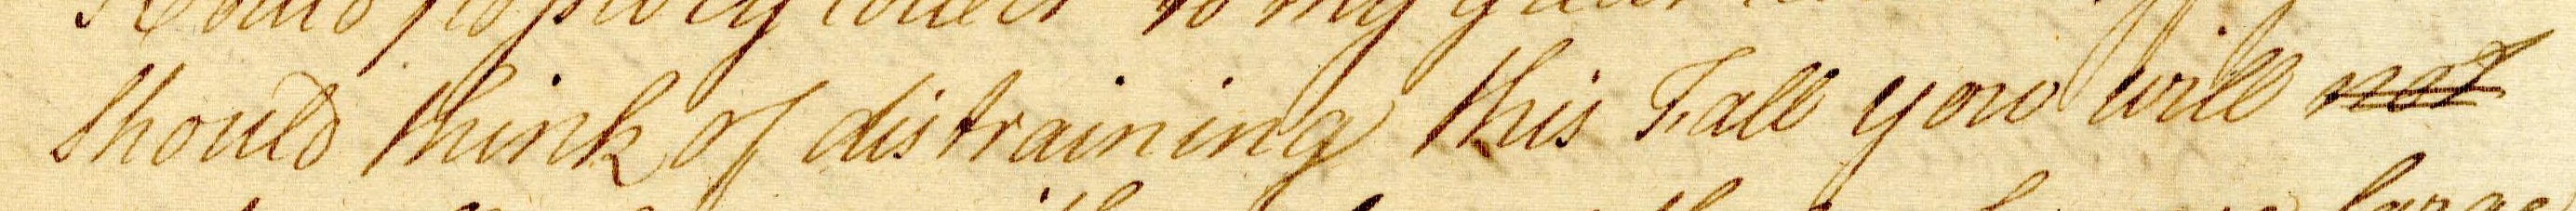should think of distraining this Fall you will [not]
